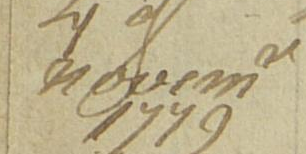Novem^r
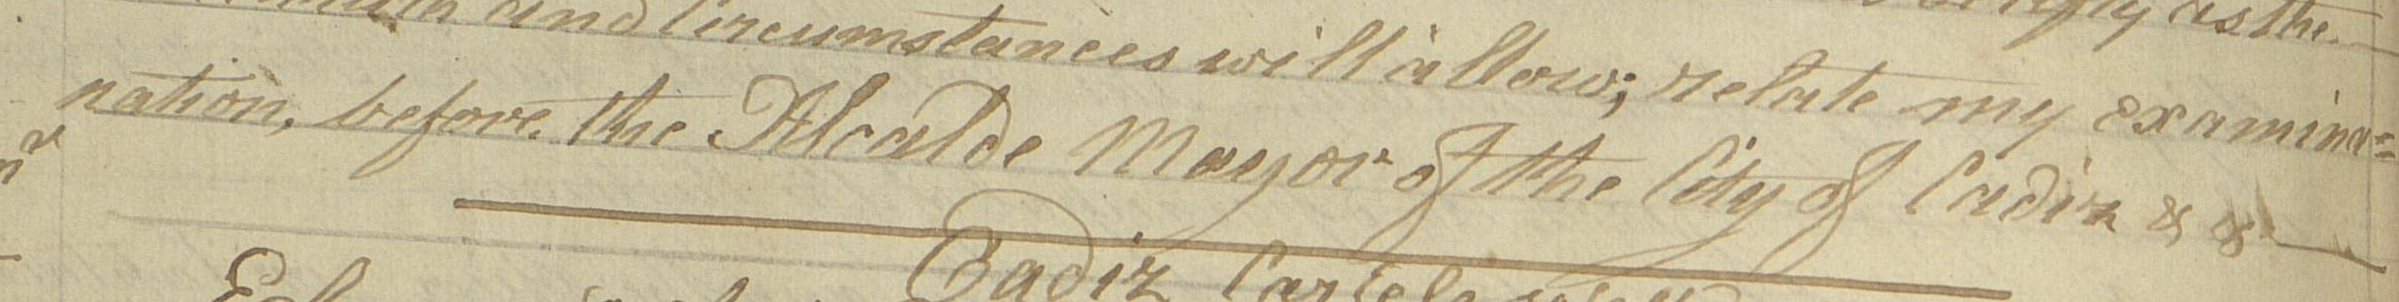-nation, before the Alecalde Mayor of the City of Cadiz & &
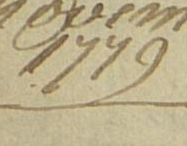1779
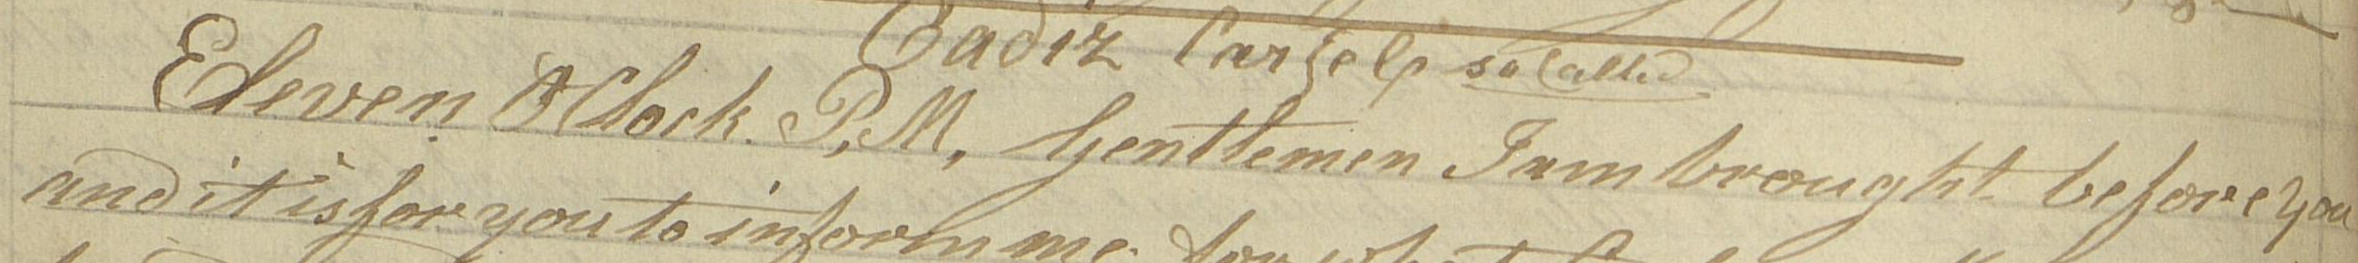Eleven OClock P.M. Gentlemen I am brought before you
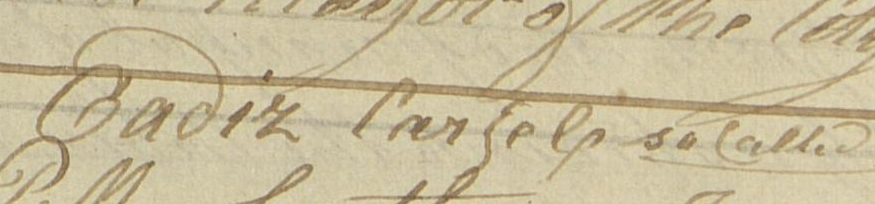Cadiz Carsel so Called
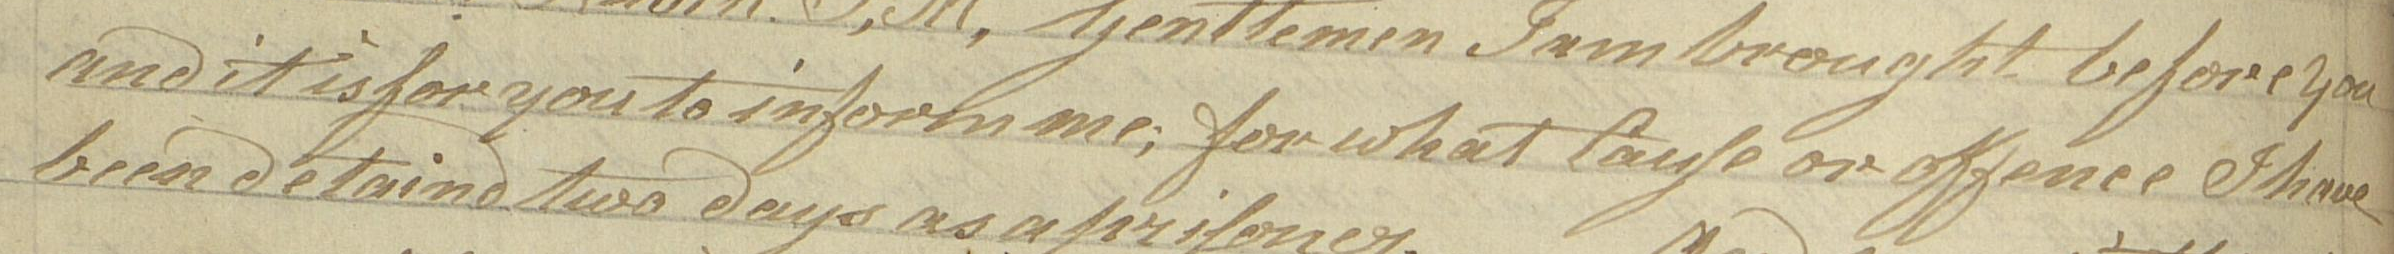and it is for you to inform me; for what Cause on offence I have
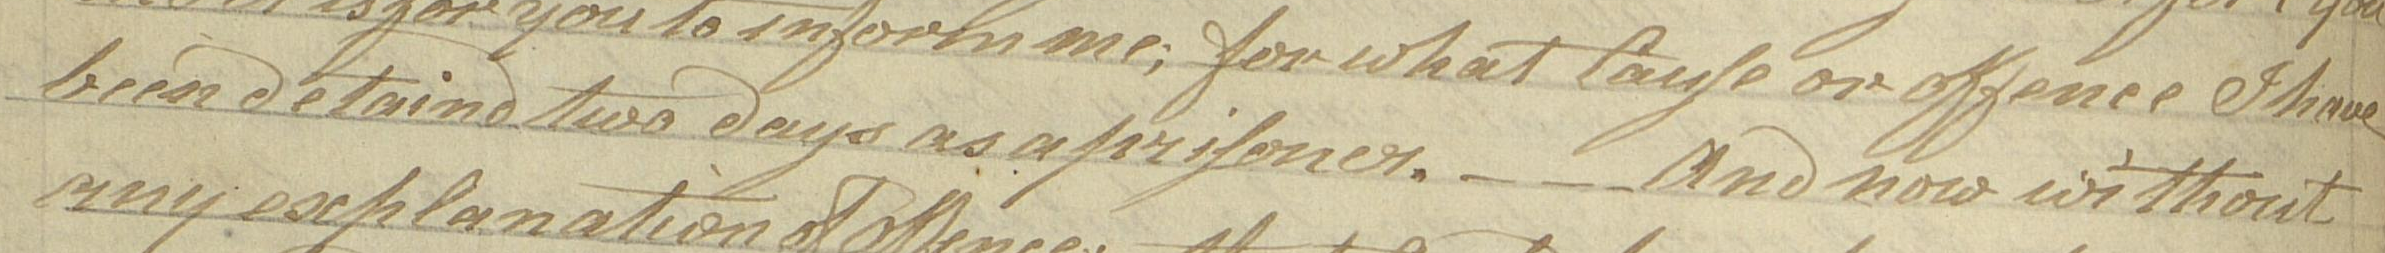been detaind two days as a prisoner. And now without
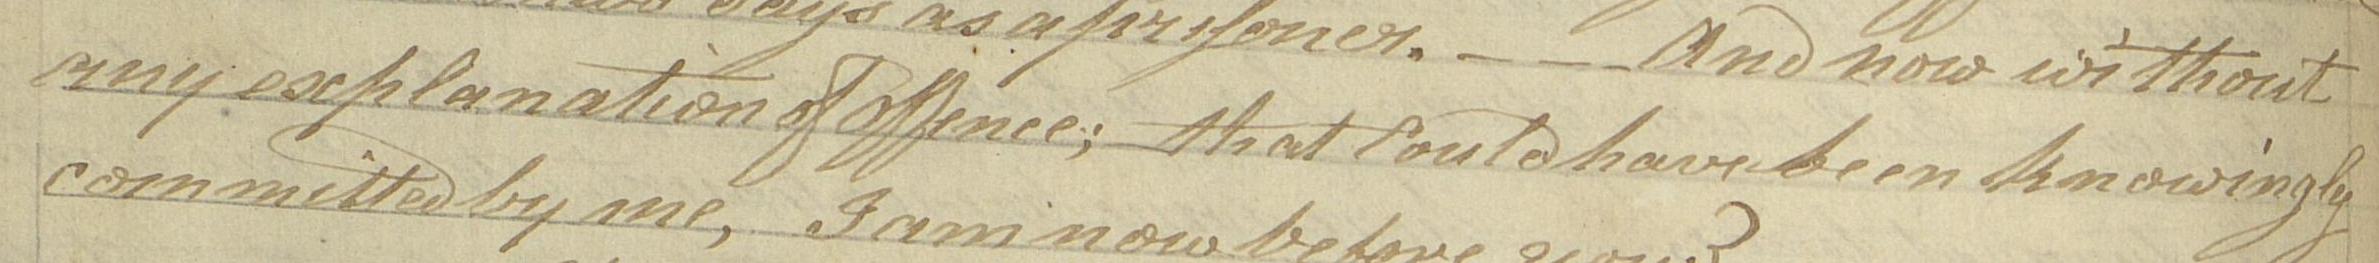any explanation of offence; that Could have been knowingly
